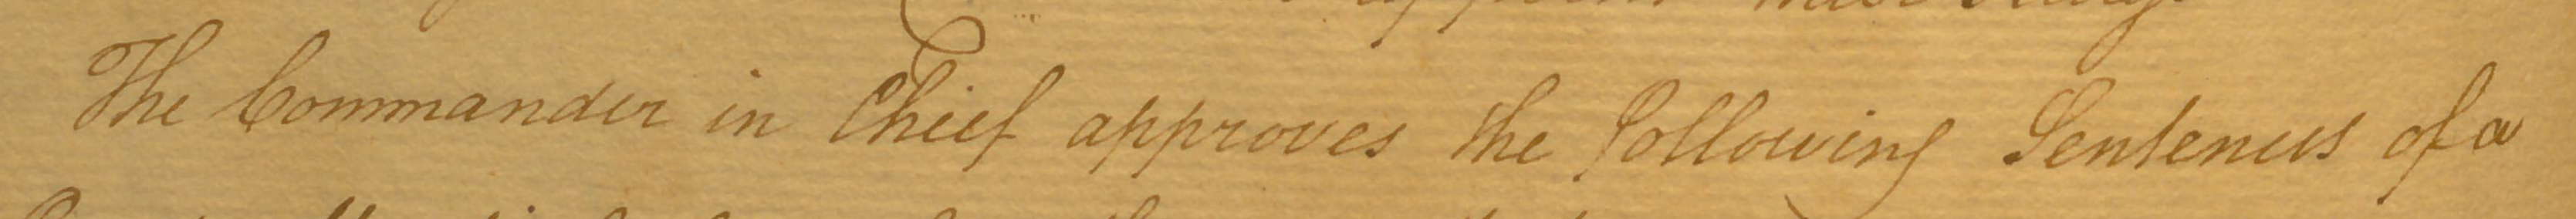The Commander in Chief approves the following Sentences of a
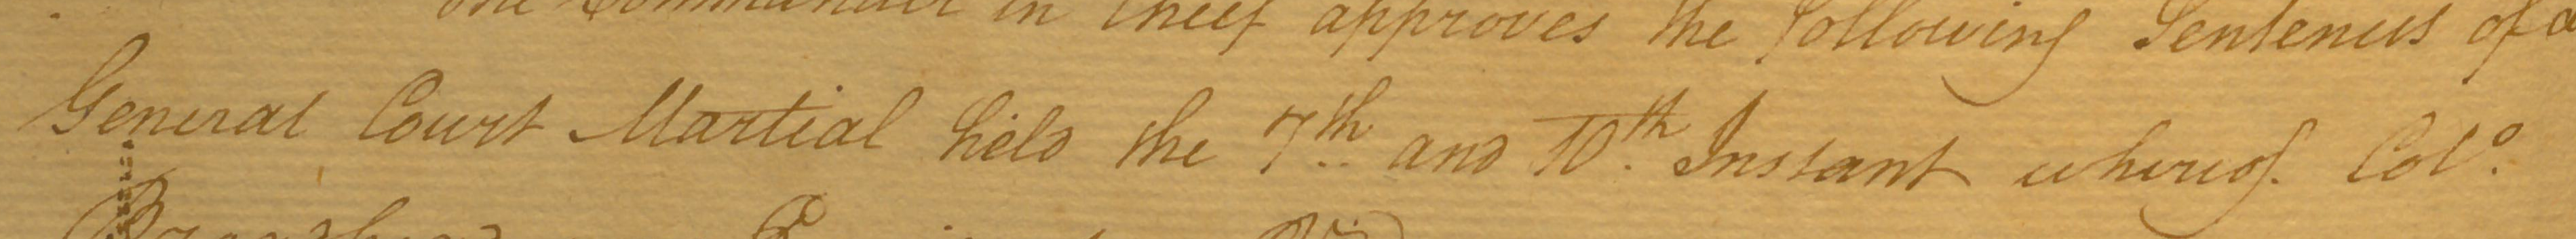General Court Martial held the 7^th. and 10^th. Instant whereof Col^o.
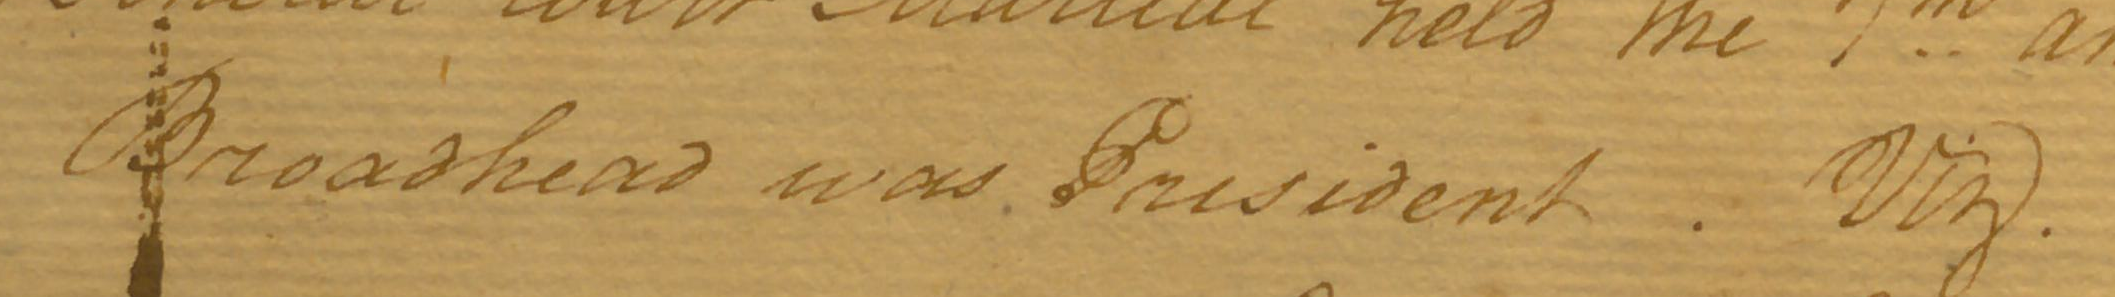Broadhead was President. Viz.
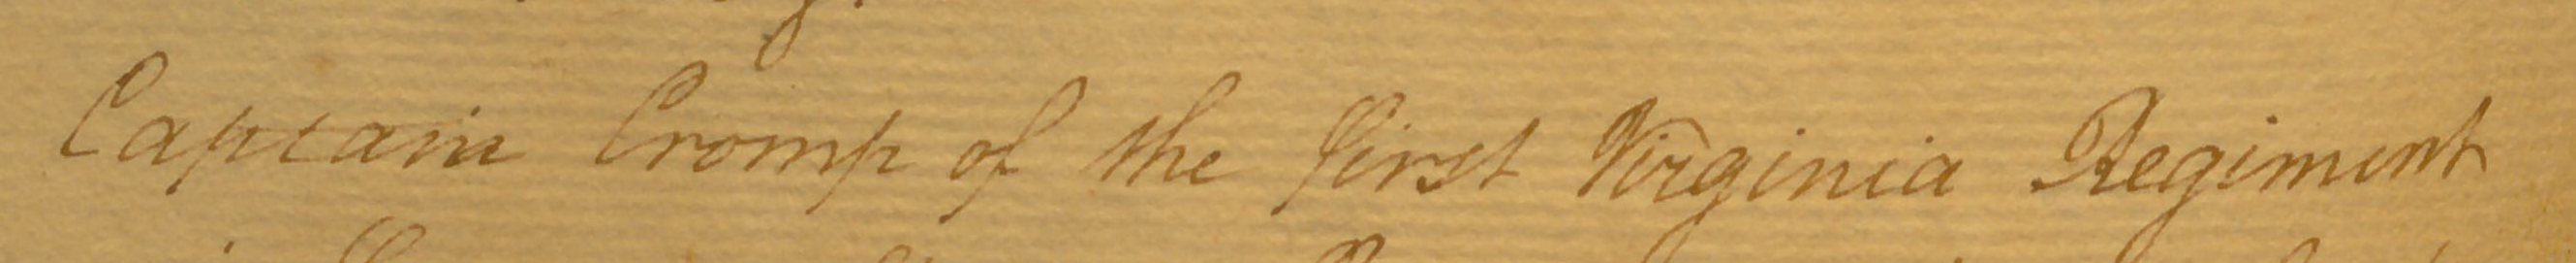Captain Cromp of the first Virginia Regiment
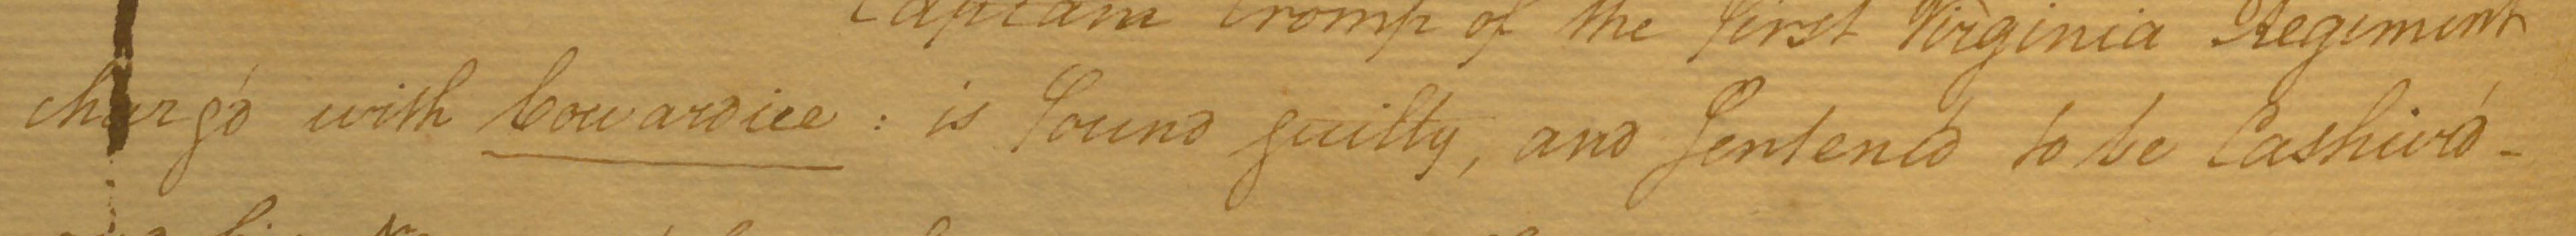charg'd with Cowardice: is found guilty, and Sentenc'd to be Cashier'd
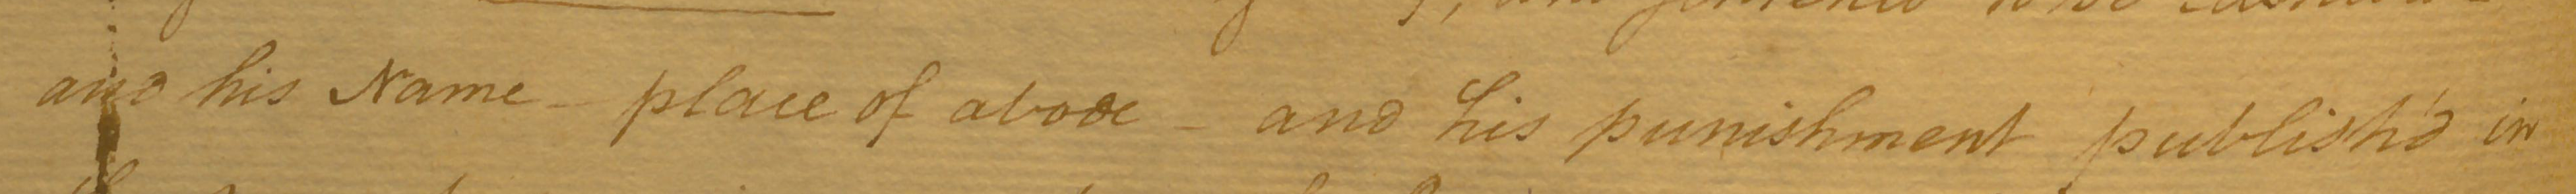and his Name- place of abode- and his punishment publish'd in
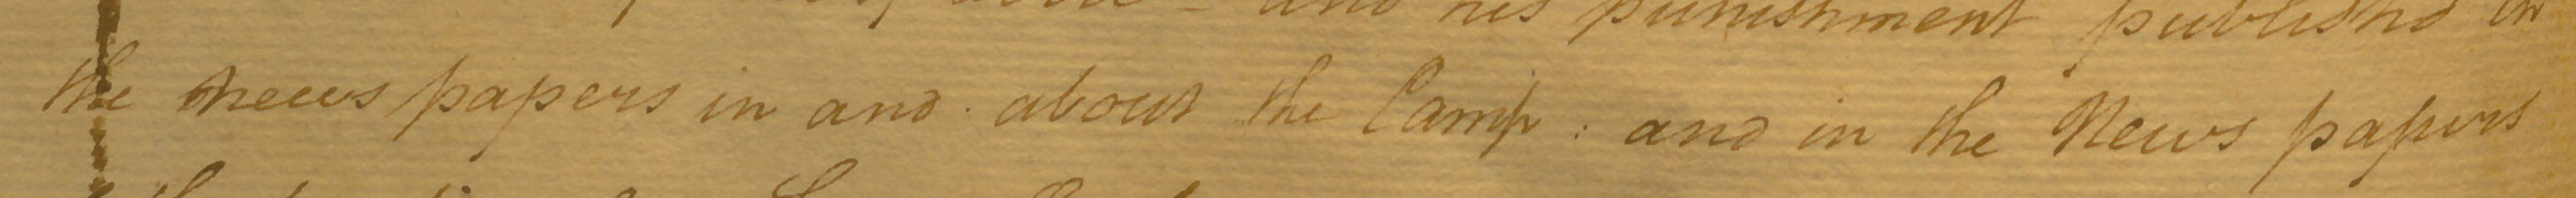the newspapers in and about the Camp: and in the Newspapers
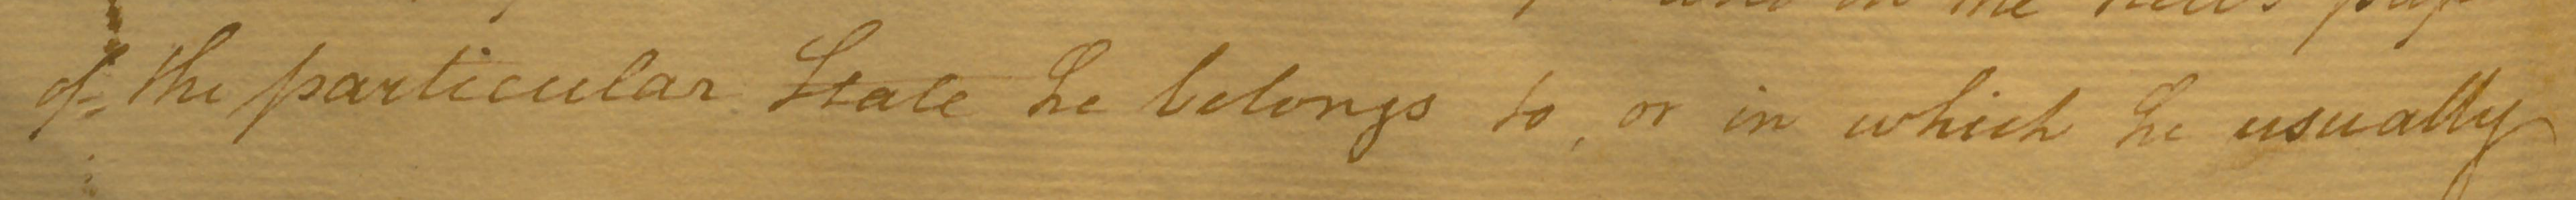of the particular State he belongs to, or in which he usually
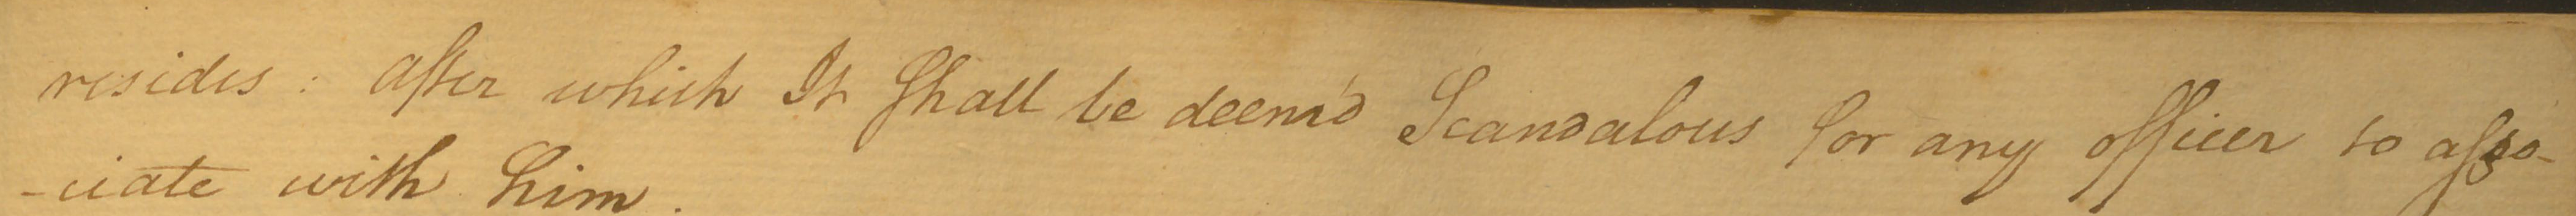resides: After which It Shall be deem'd Scandalous for any officer to asso-
